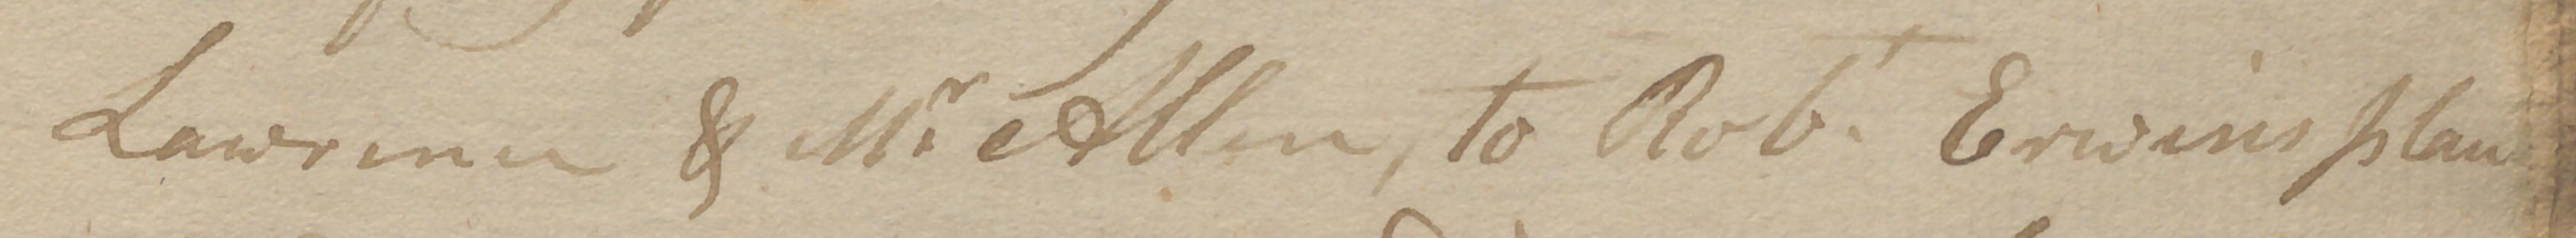Lawrence & M^r. Allen, to Rob^t Erwins plan
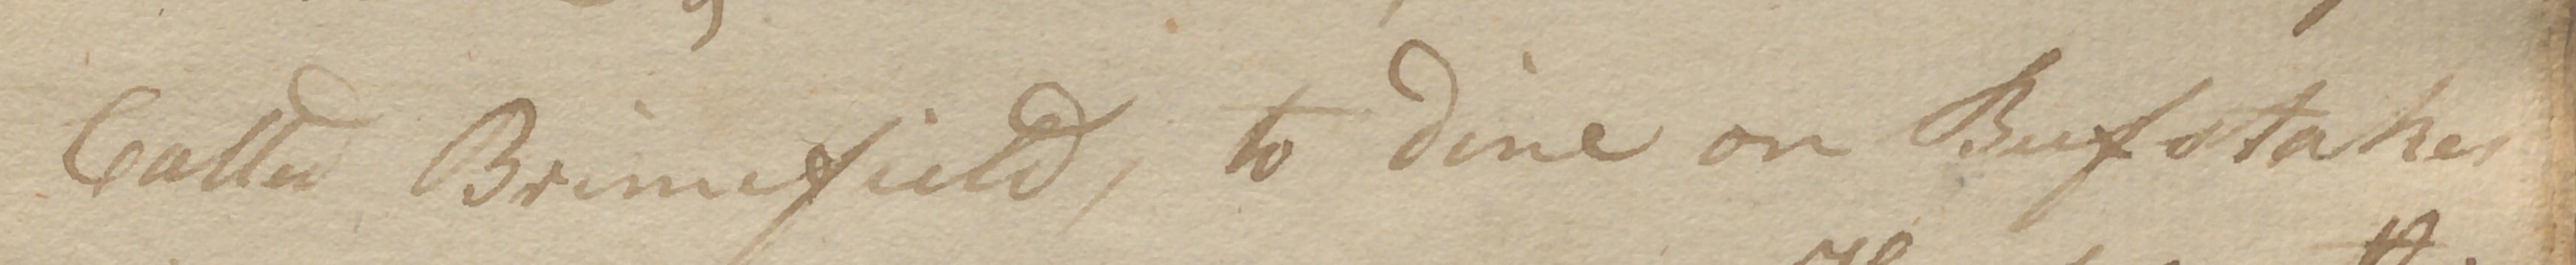Called Brimefield, to dine on Beefstakes
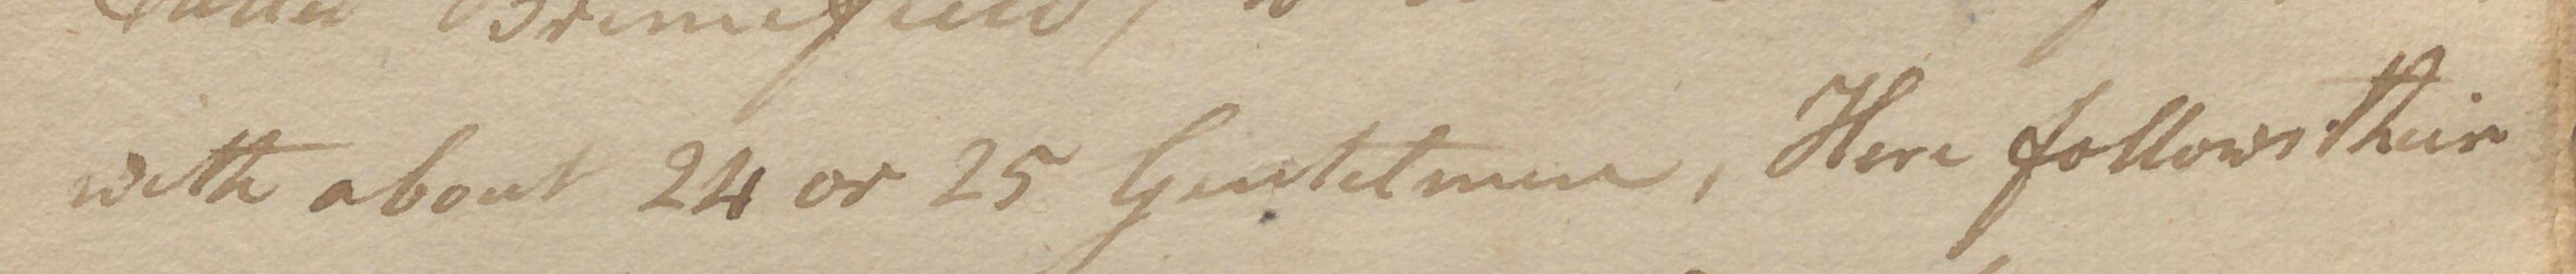with about 24 or 25 Gentelmen, Here follows their
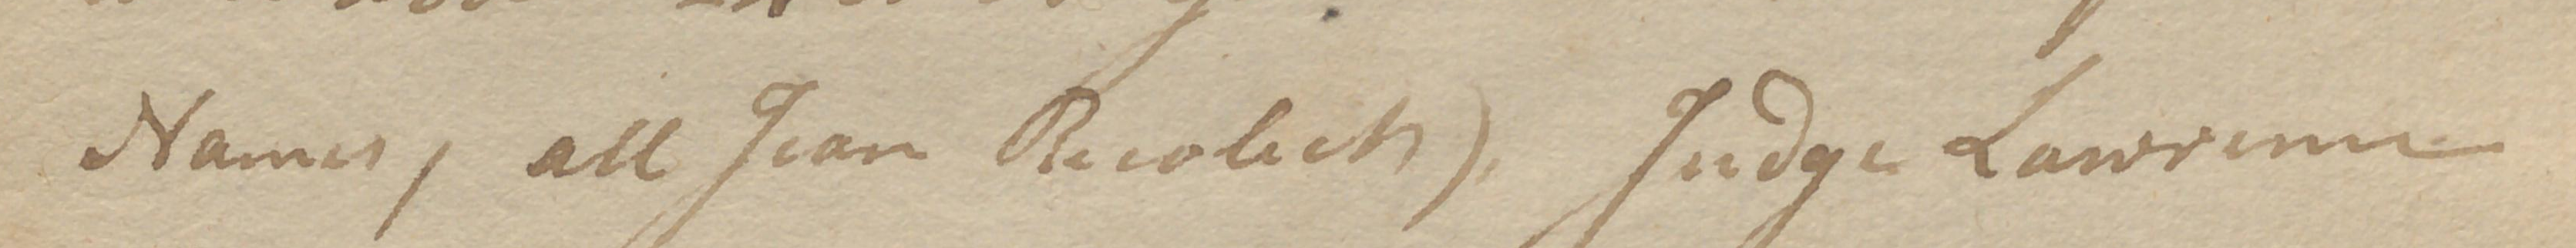Names, all Jean Recolech Judge Lawrence
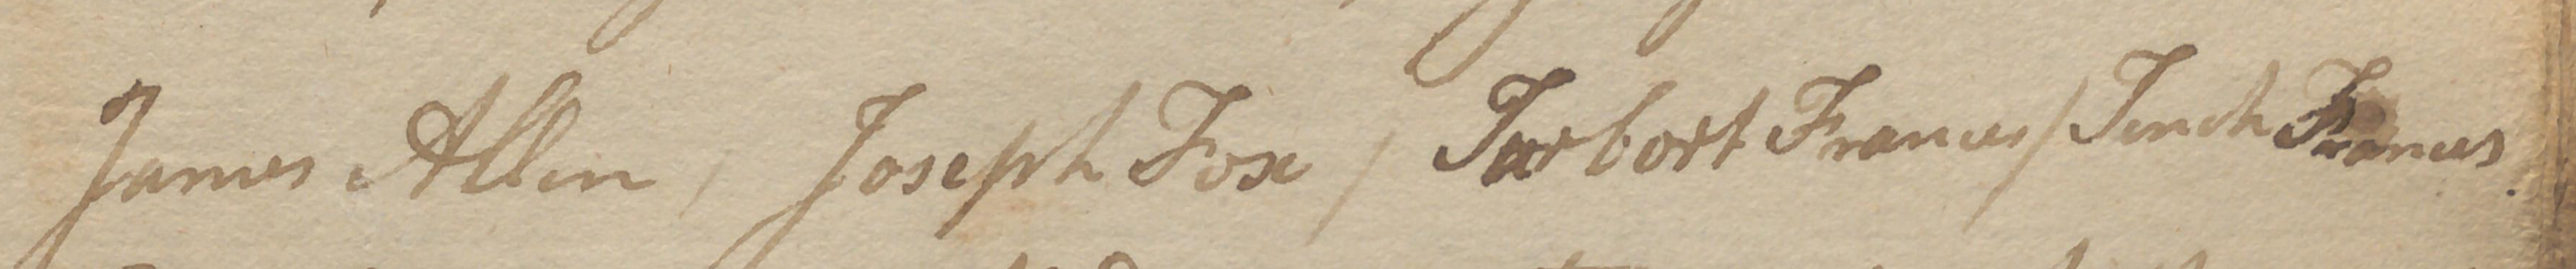James Allen, Joseph Fox, Tabort Frances) Tench Frances
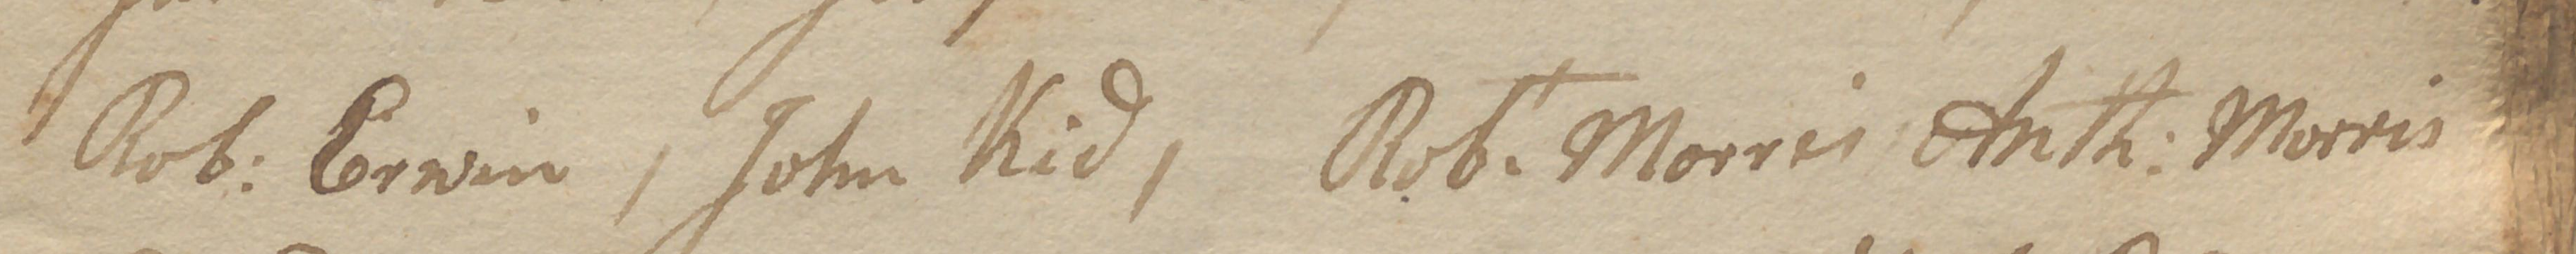Rob: Erwin, John Kid, Rob^t. Morris Anth: Morris
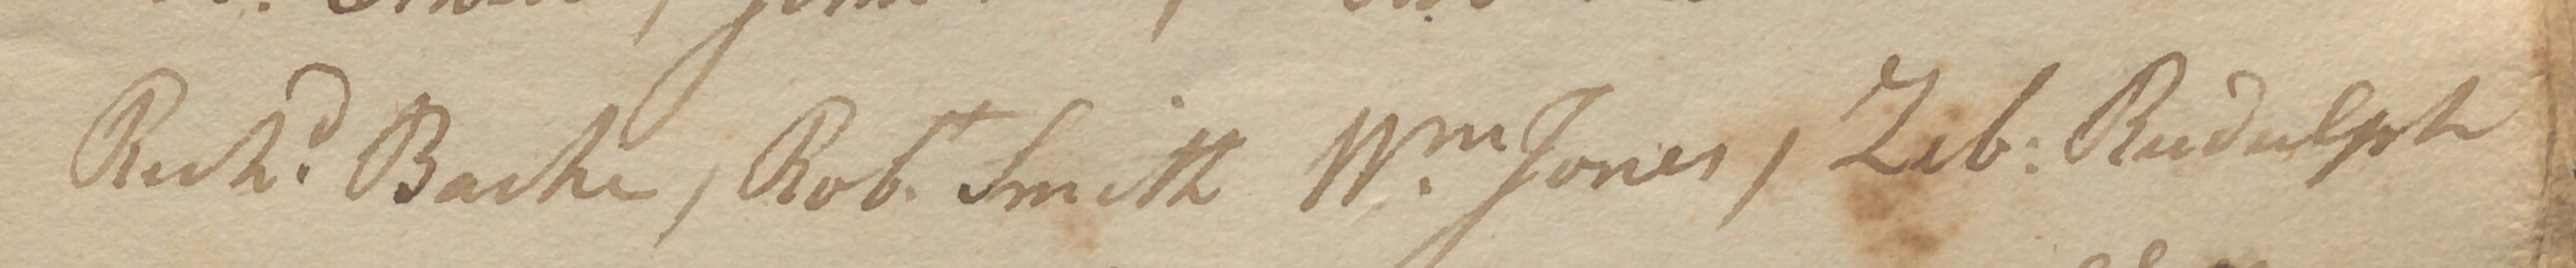Rich^d. Bache, Rob^t. Smith W^m. Jones, Zeb: Rudulph
